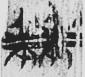兼
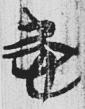○（愛）
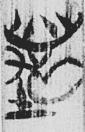○（萬）
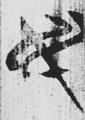民
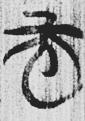而
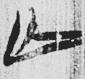亡
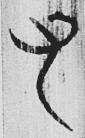又（有）
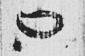厶（私）
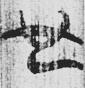也
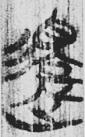還
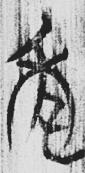年
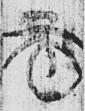而
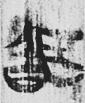䎽（問）
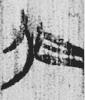於
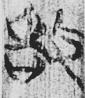○（曹）
